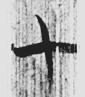七
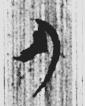人
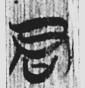君
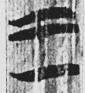王
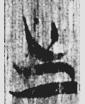之
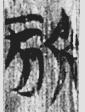所
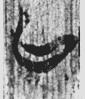㠯（以）
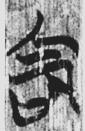命
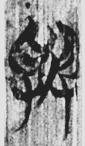與
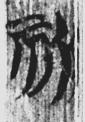所
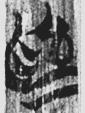爲
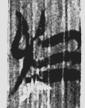於
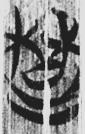楚
